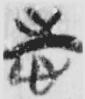志
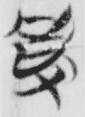事
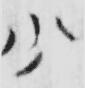少
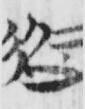○（遲）
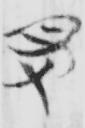○（得）
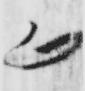㠯（以）
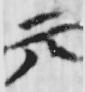亓（其）
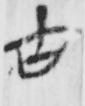古（故）
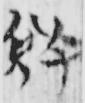敓
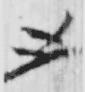之
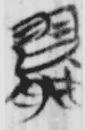○（一）
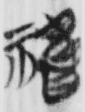禱
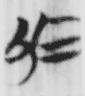於
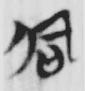卲
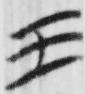王
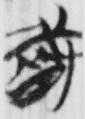戠
